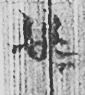廿=
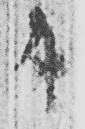千
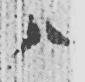八
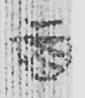百
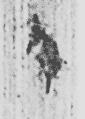千
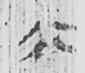六
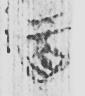百
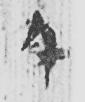千
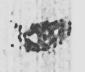四
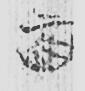百
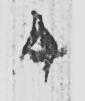千
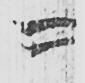二
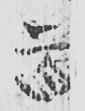百
